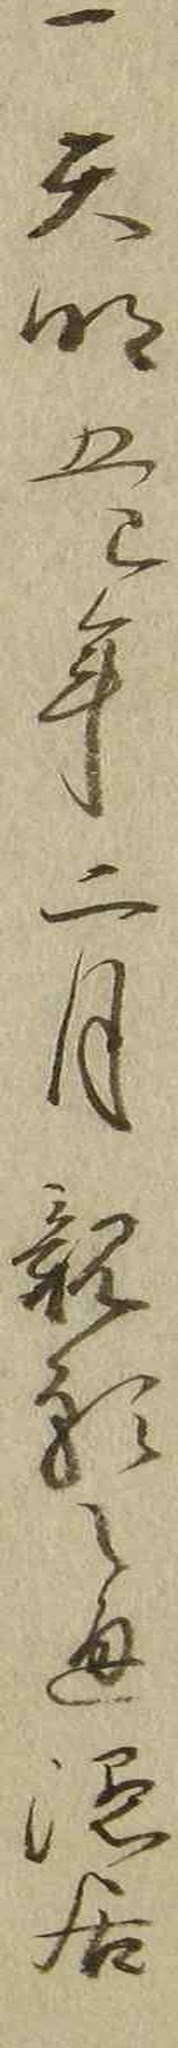一天明五巳年二月親願之通隠居
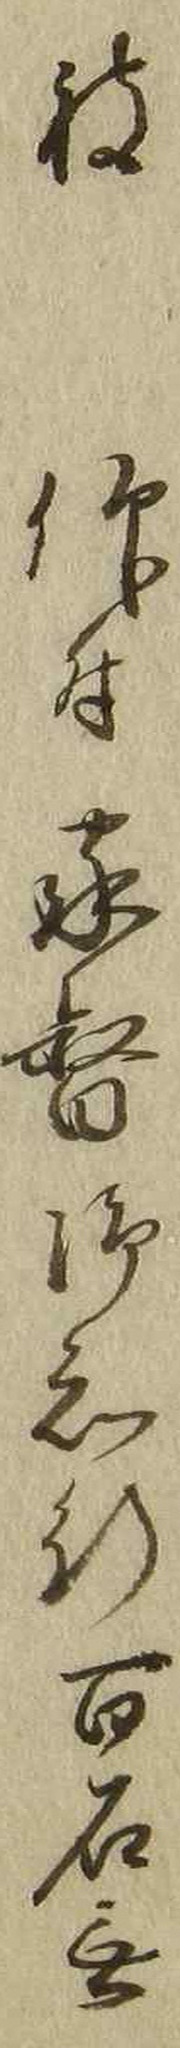被仰付家督御知行百石無
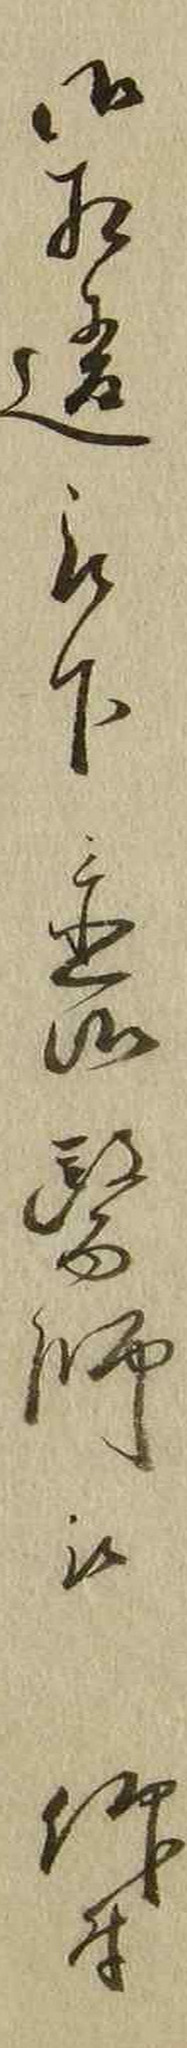御相違被下置御医師被仰付
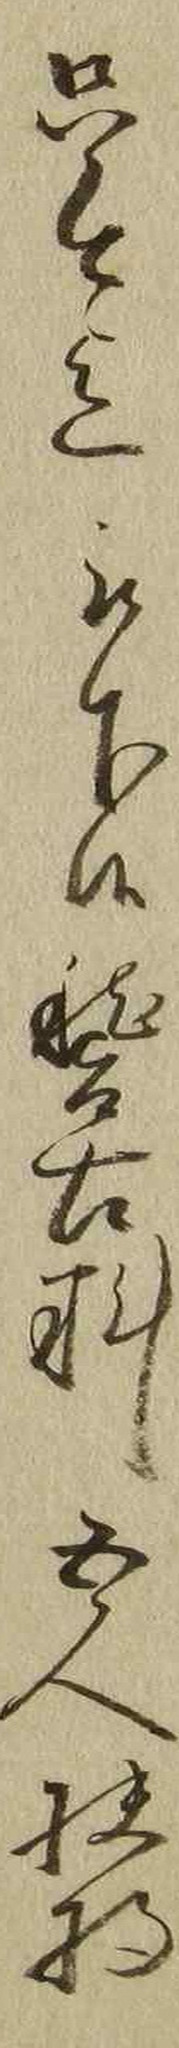只今迄被下候稽古料五人扶持
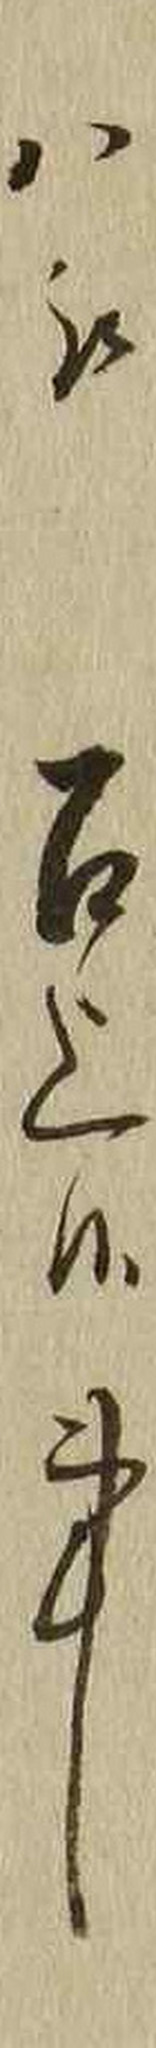ハ被召上候事
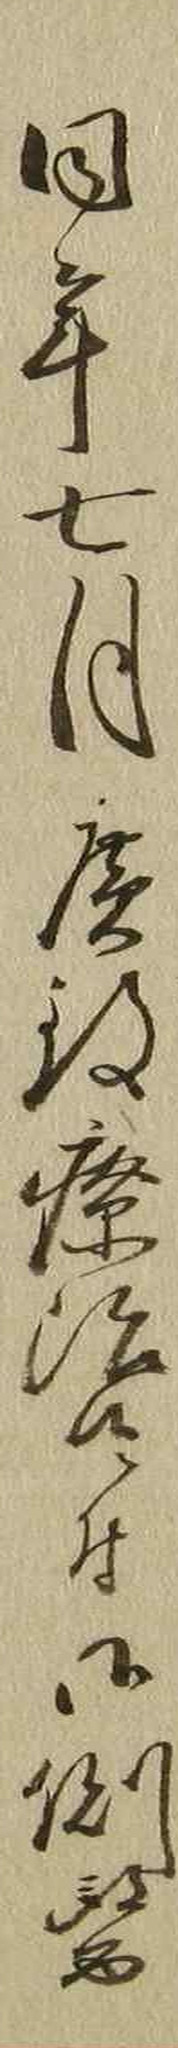一同年七月広致療治候ニ付御側医
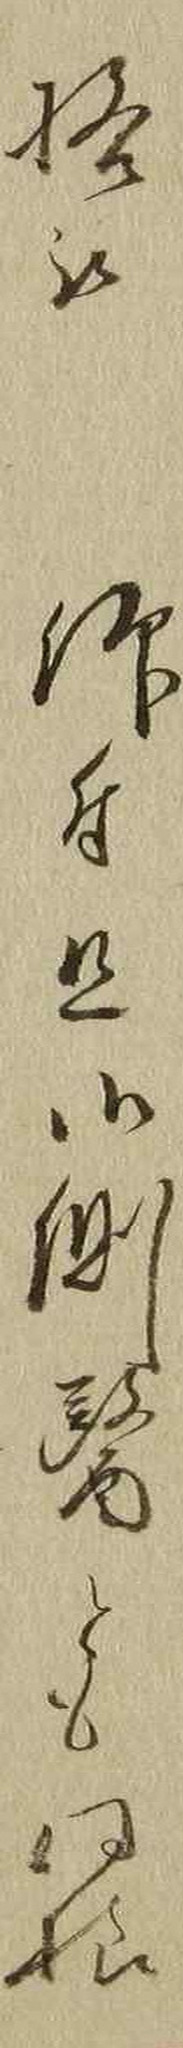挌被仰付且御側医とも同様
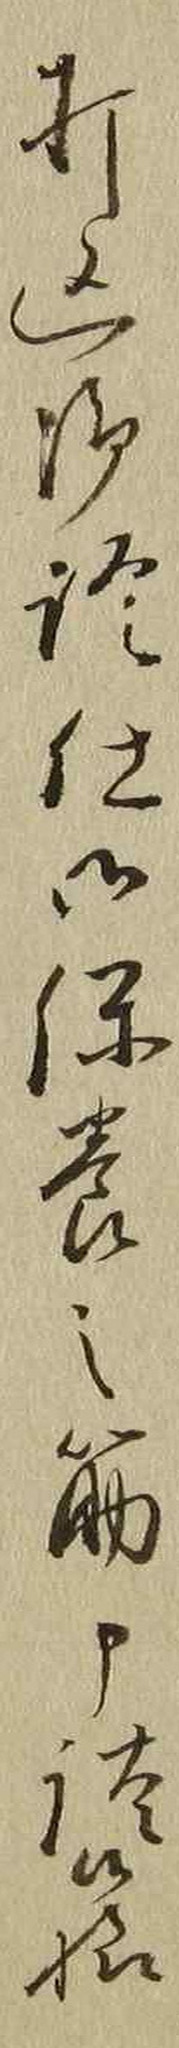打込御診仕御保養之筋申談候様
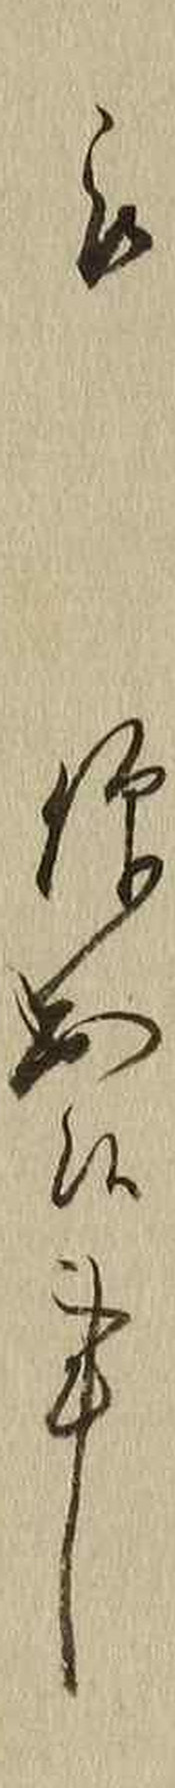被仰出候事
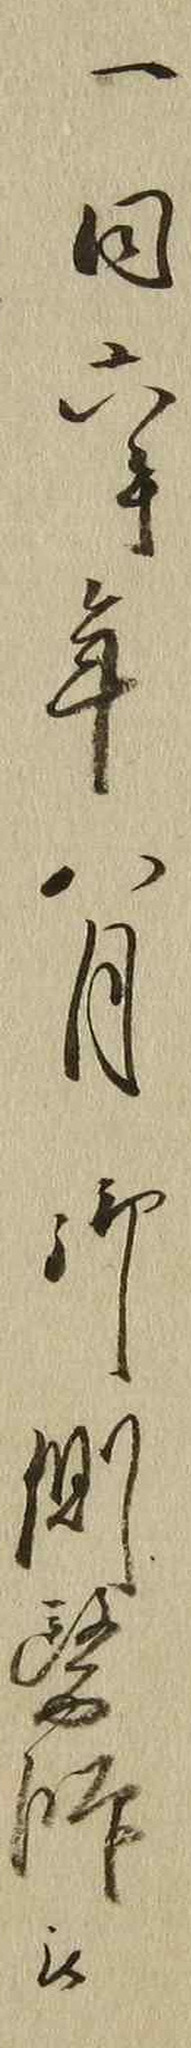一同六午年八月御側医師被
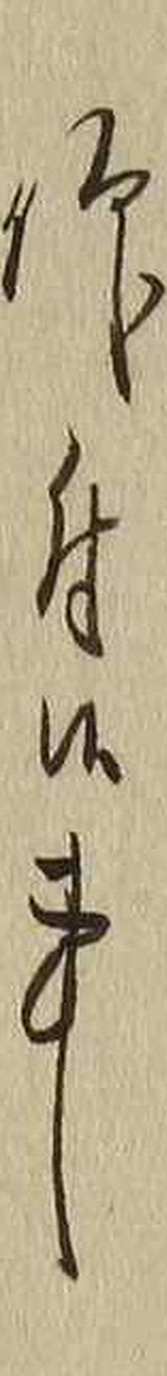仰付候事
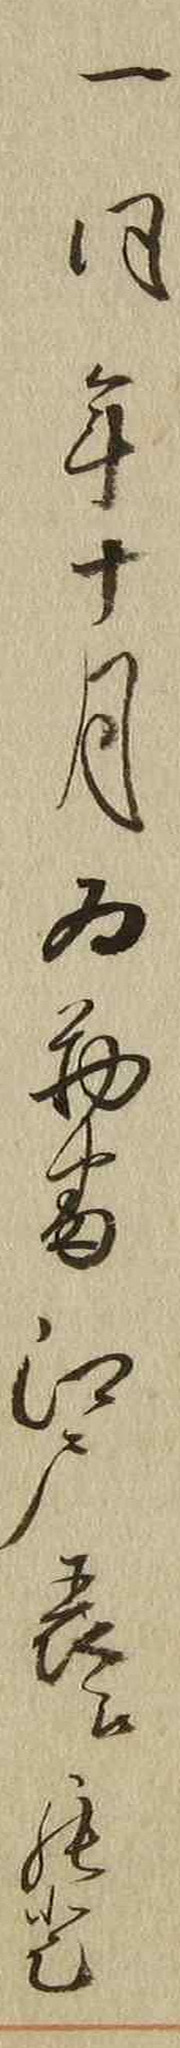一同年十月為勤番江戸表江罷登
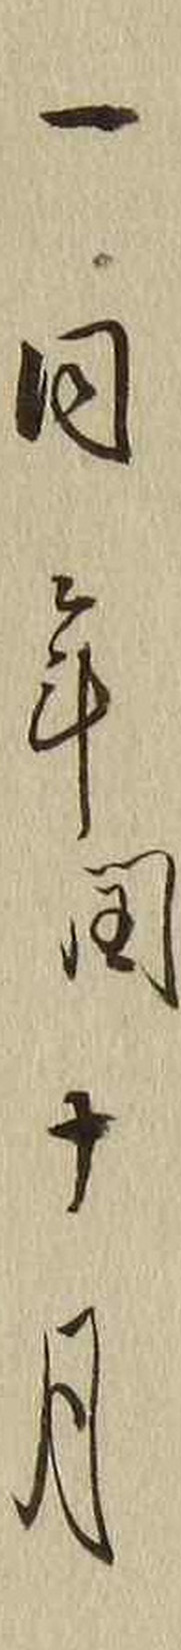一同年閏十月
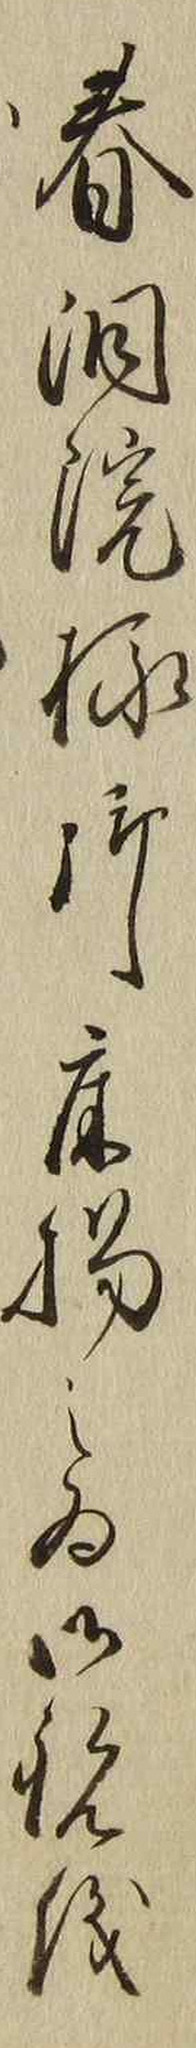春洞院様御床揚之為御祝儀
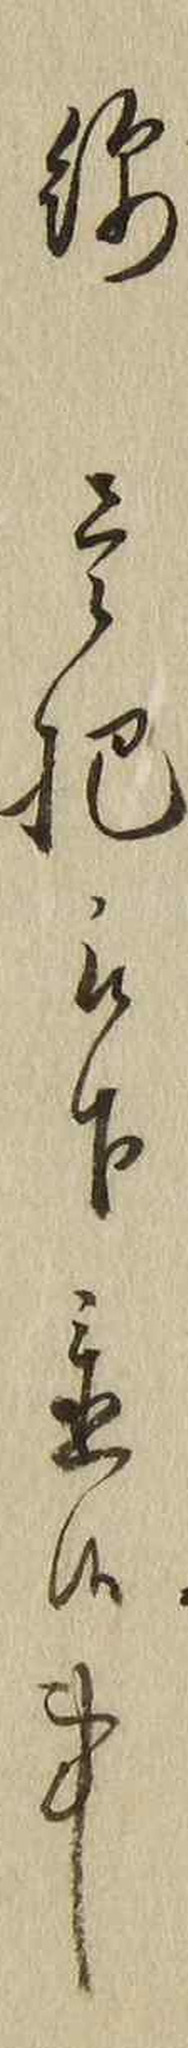綿壱把被下置候事
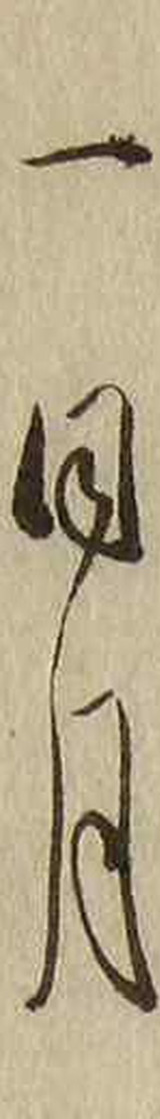一同月
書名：諸士系譜　巻之68　を之部2
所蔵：会津若松市立会津図書館
